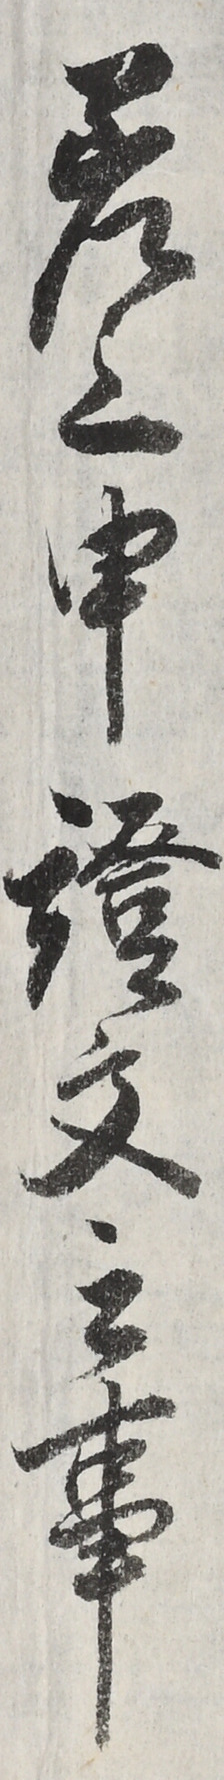差上申証文之事
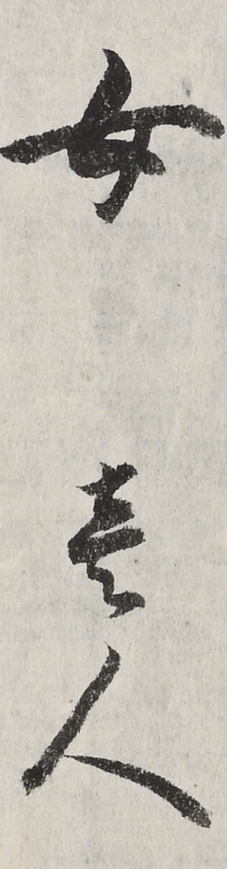女壱人
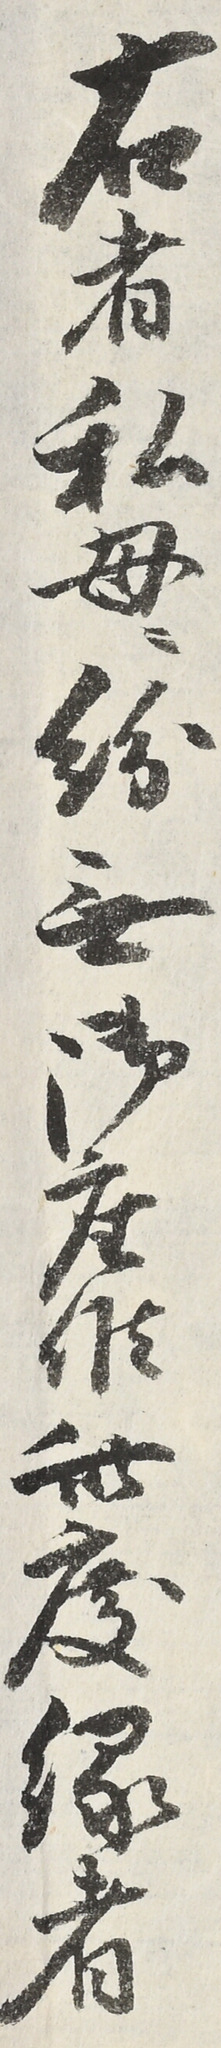右者私母ニ紛無御座候此度縁者
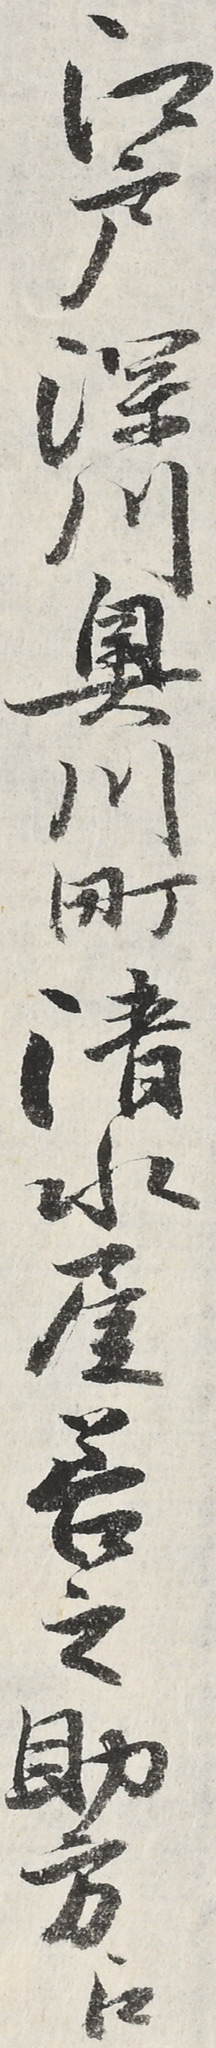江戸深川奥川町清水屋善之助方江
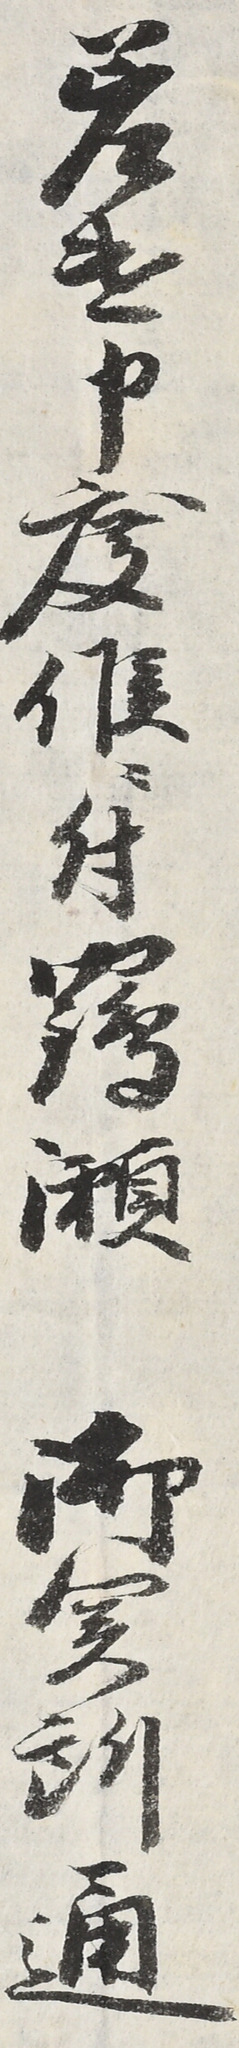差遣申度候ニ付靏瀬御関所通
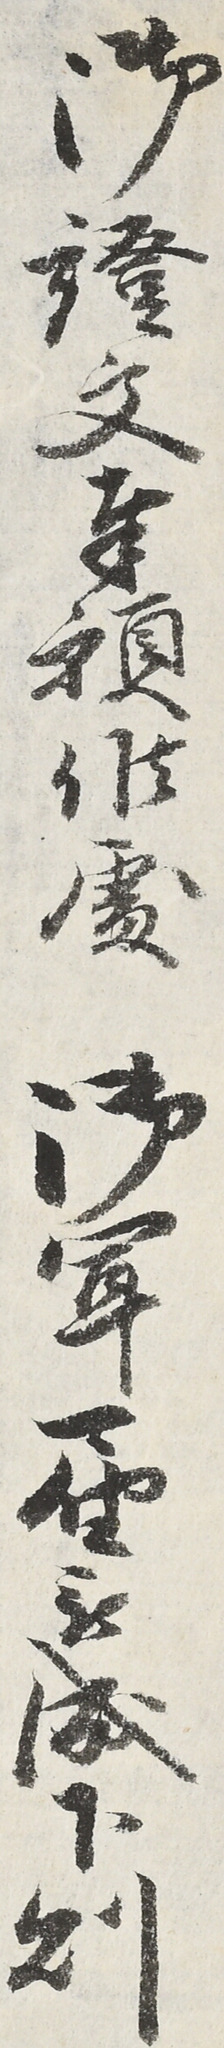御証文奉願候処御聞届被成下則
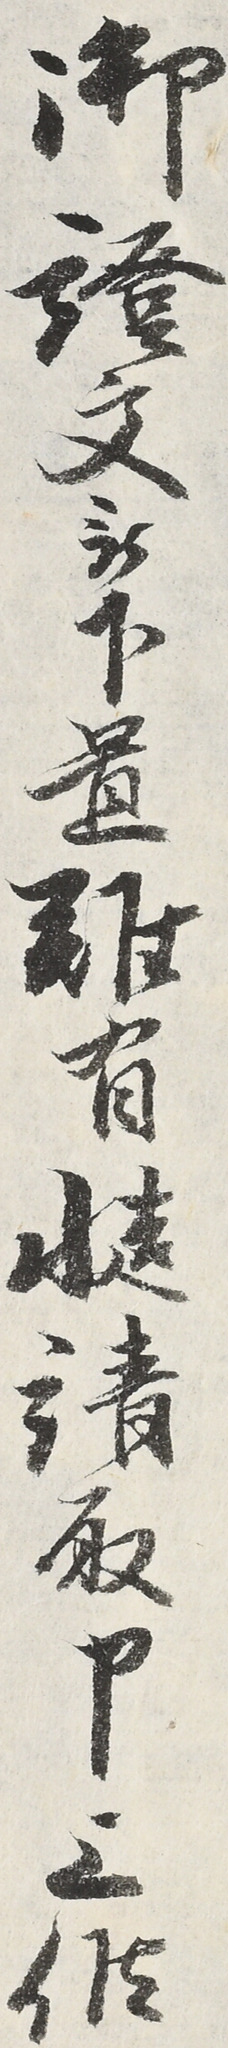御証文被下置難有慥請取申上候
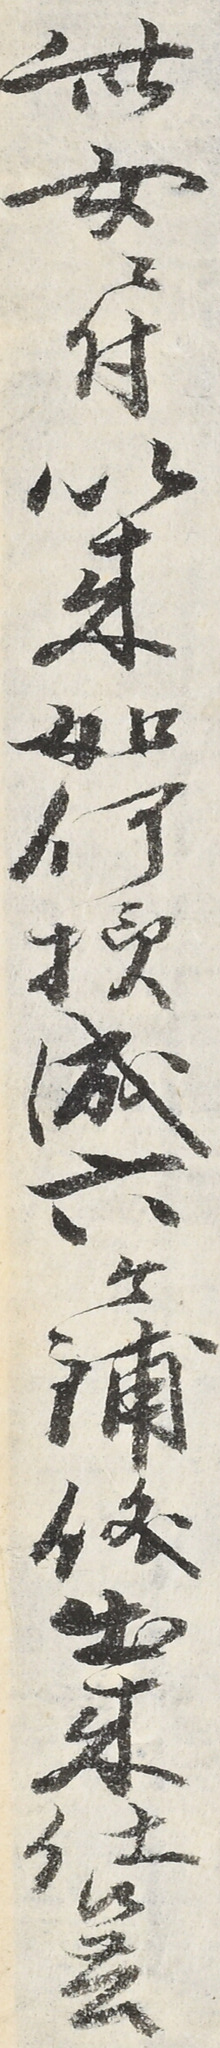此女ニ付以来如何様成六ヶ鋪儀出来仕候共
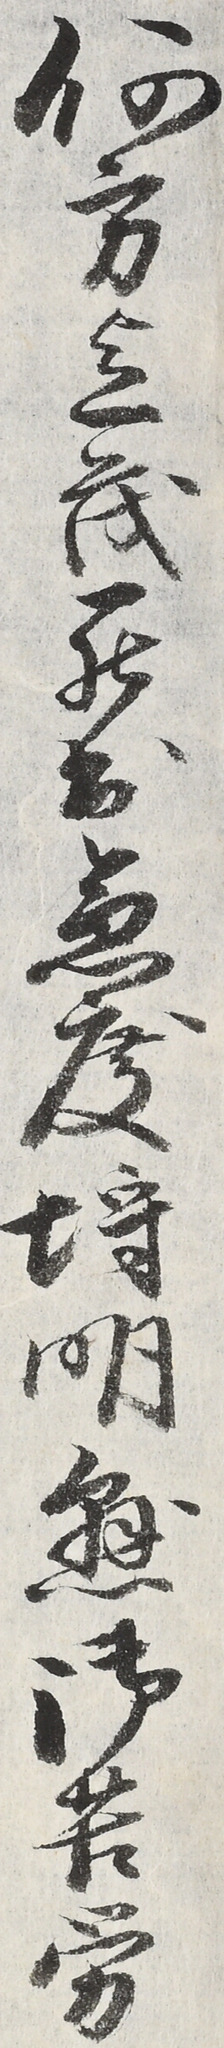何方迄茂罷出急度埒明懸御苦労
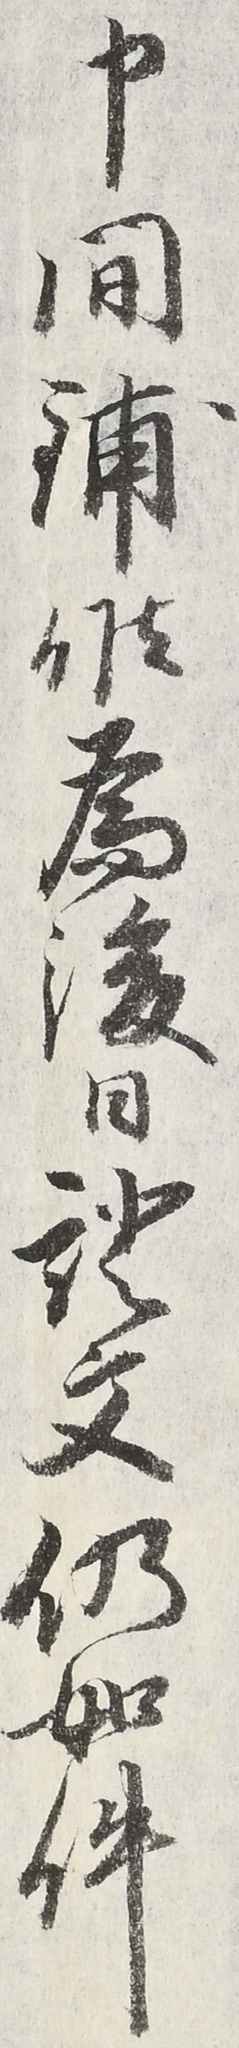申間鋪候為後日証文仍如件
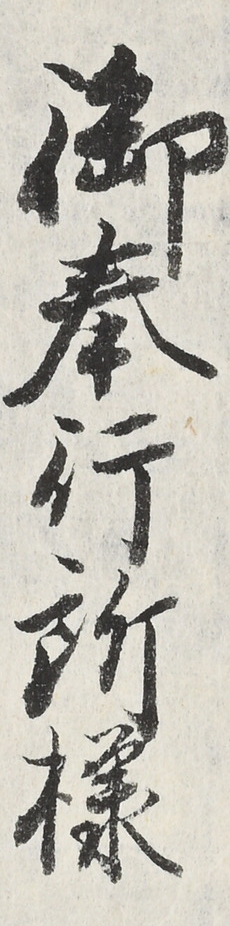御奉行所様
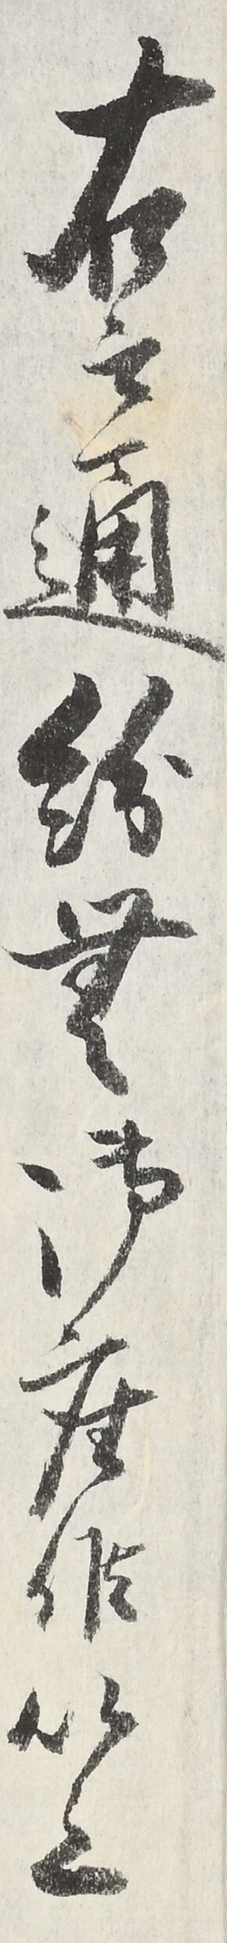右之通紛無御座候以上
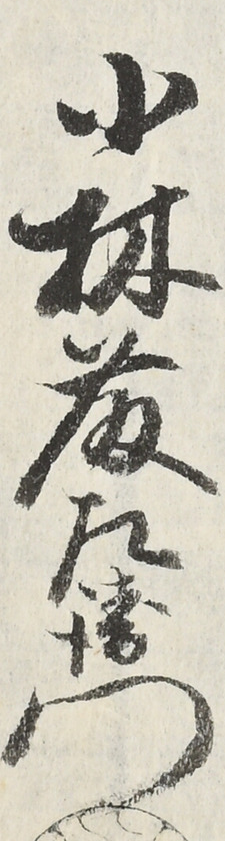小林藤左衛門㊞
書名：差上申證文之事
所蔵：伊那市立高遠町図書館・合同会社AMANE
